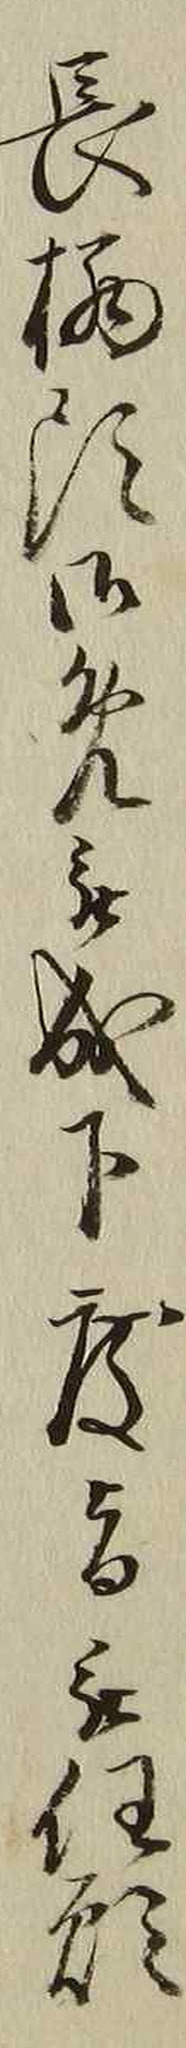長柄頭御免被成下度旨被任願
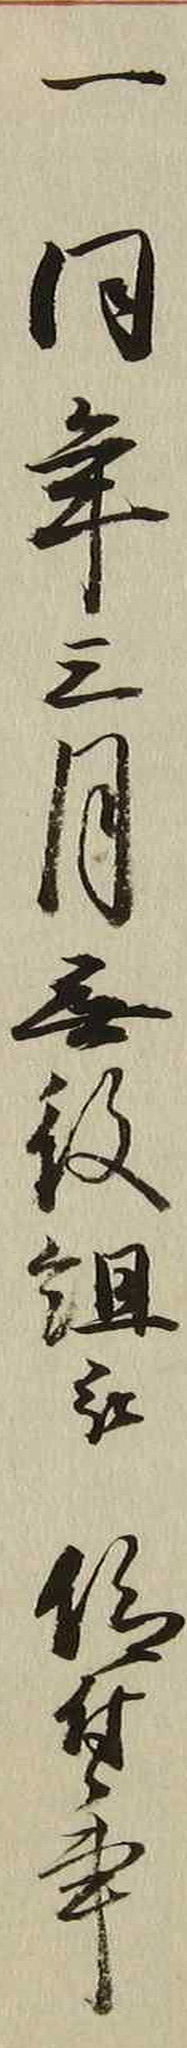一同年三月無役組被仰付候事
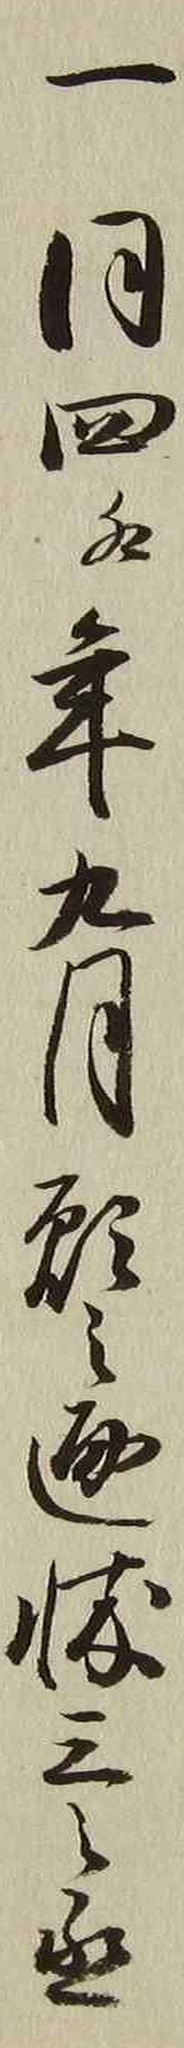一同四卯年九月願之通忰三之丞
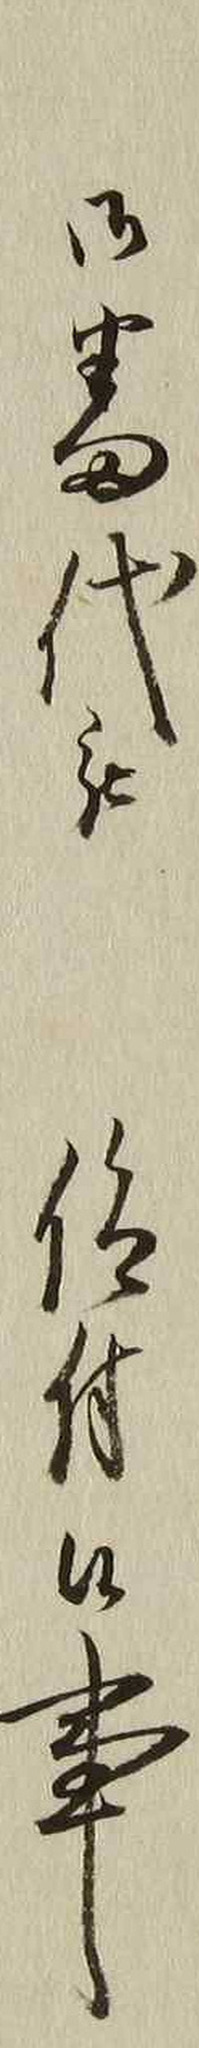御番代被仰付候事
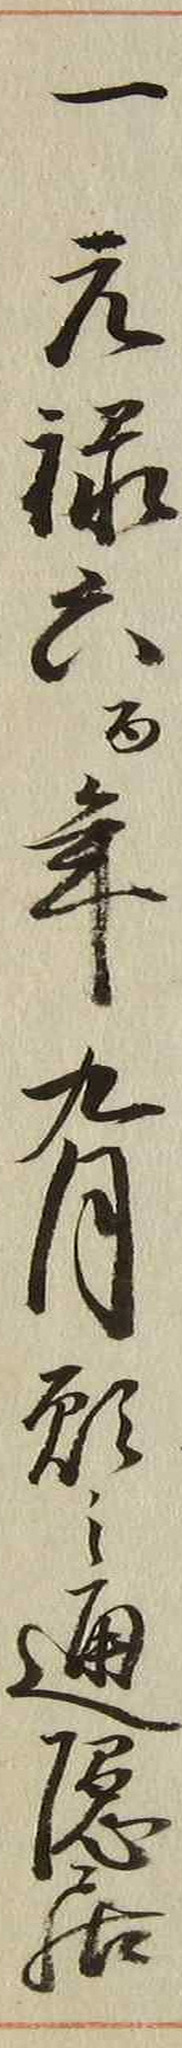一元禄六酉年九月願之通隠居
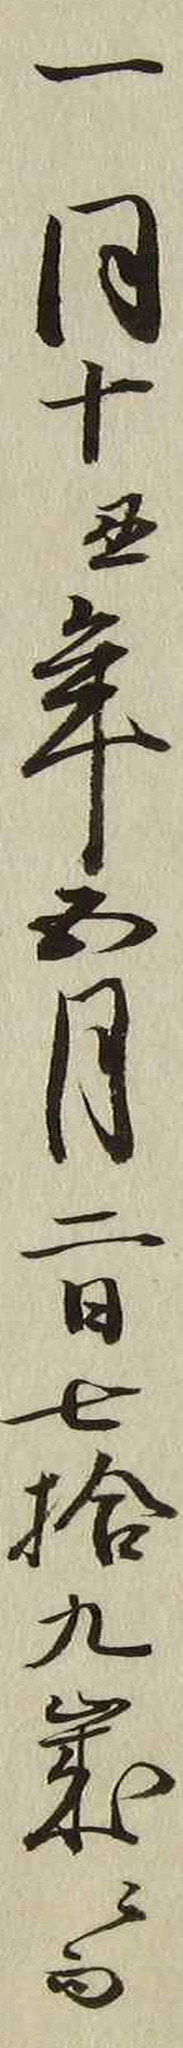一同十丑年五月二日七拾九歳ニ而
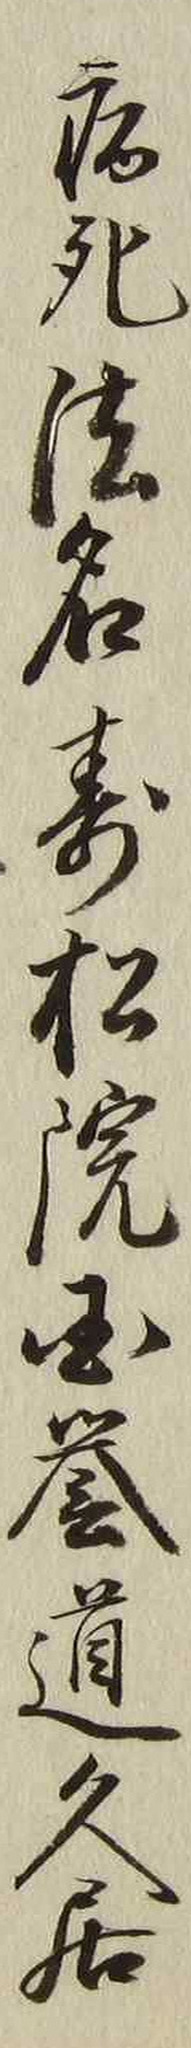病死法名寿松院国誉道久居
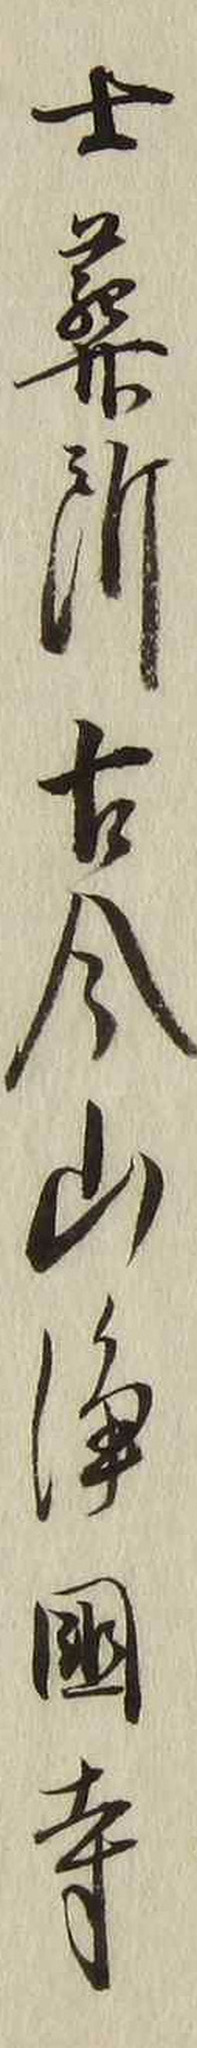士葬所古今山浄国寺
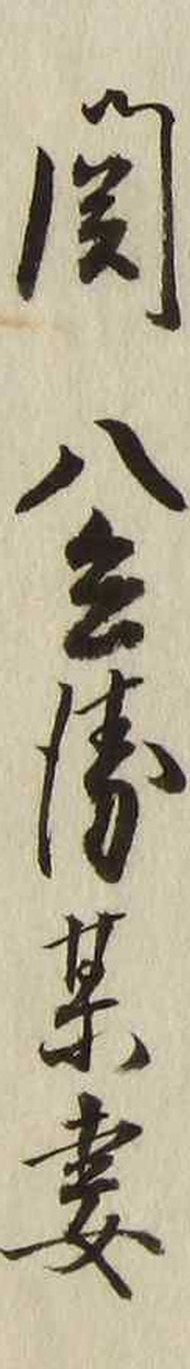女関八兵衛某妻
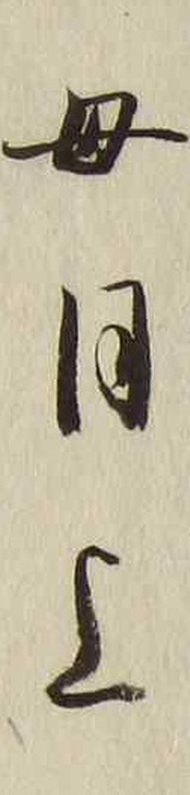母同上

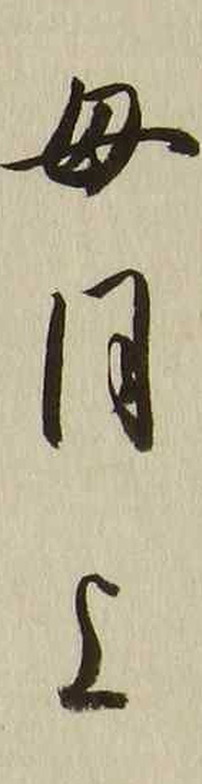母同上
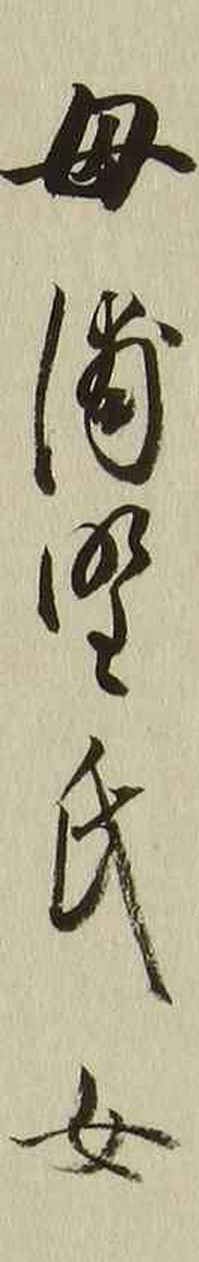母浦野氏女
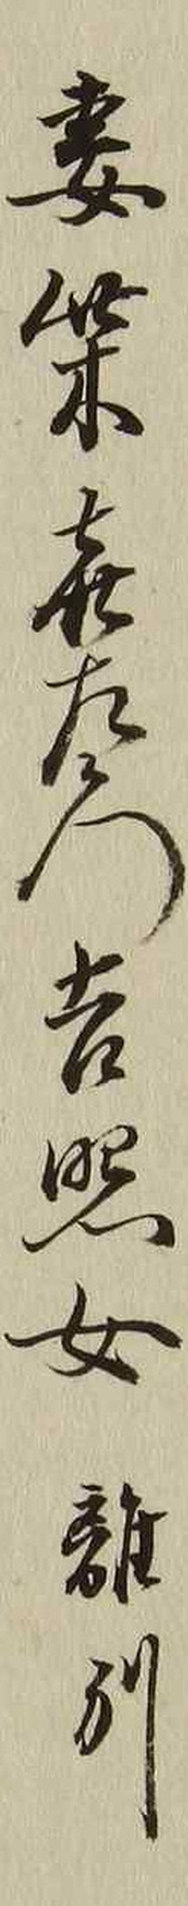妻柴㐂左衛門吉照女離別
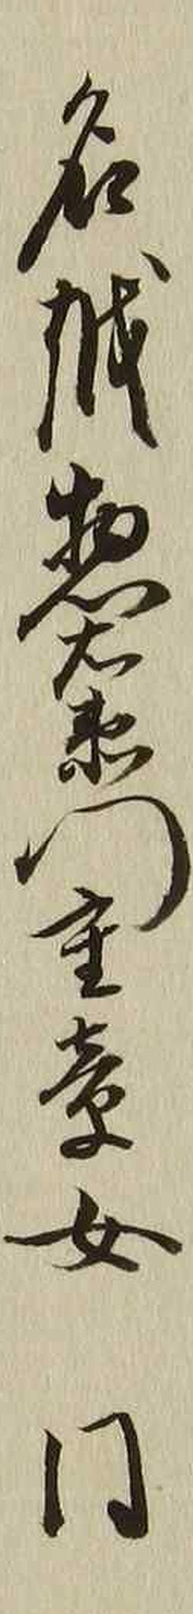名越惣右衛門重章女同
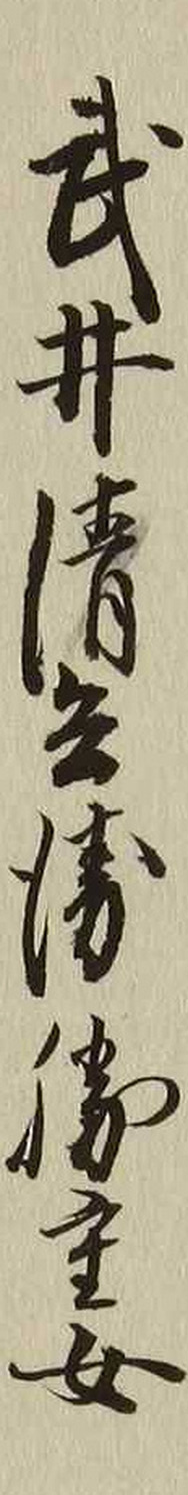武井清兵衛勝重女
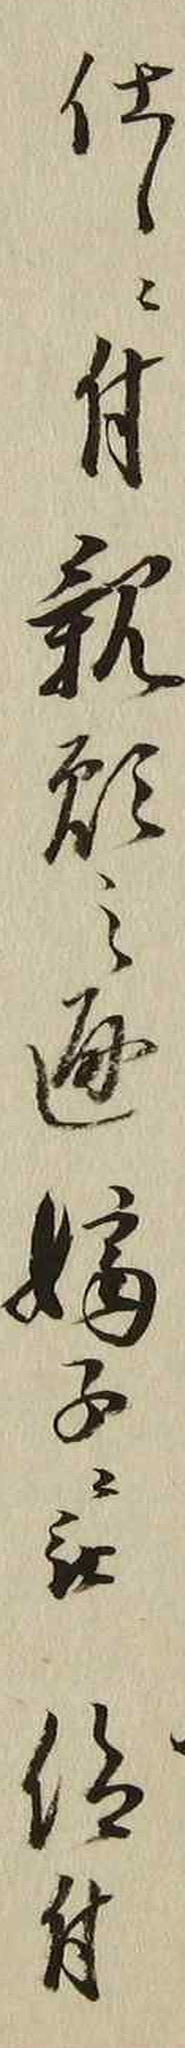仕候ニ付親願之通嫡子ニ被仰付
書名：諸士系譜　巻之69　を之部3
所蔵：会津若松市立会津図書館
